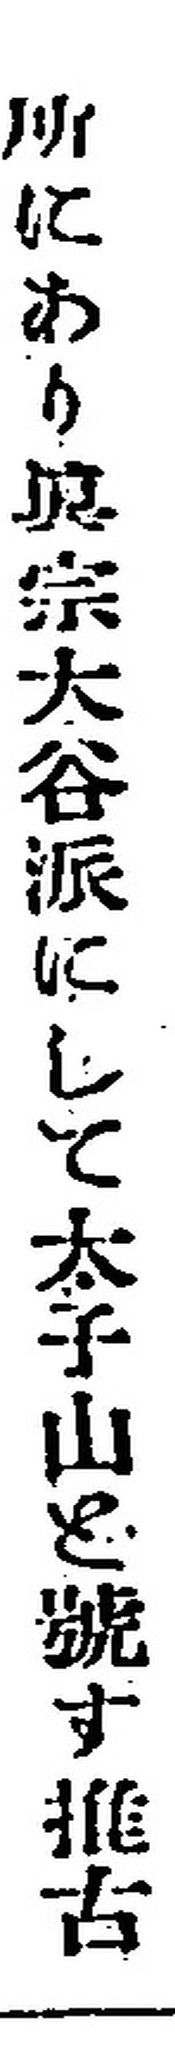所にあり真宗大谷派にして太子山と号す推古
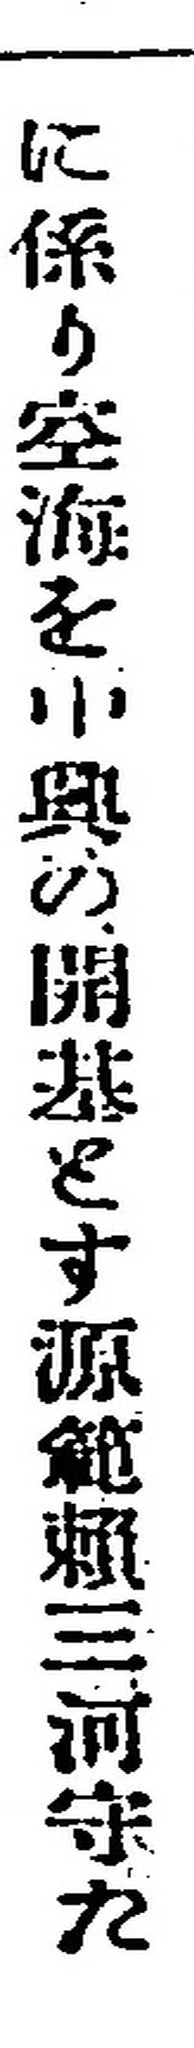に係り空海を中興の開基とす源範頼三河守た
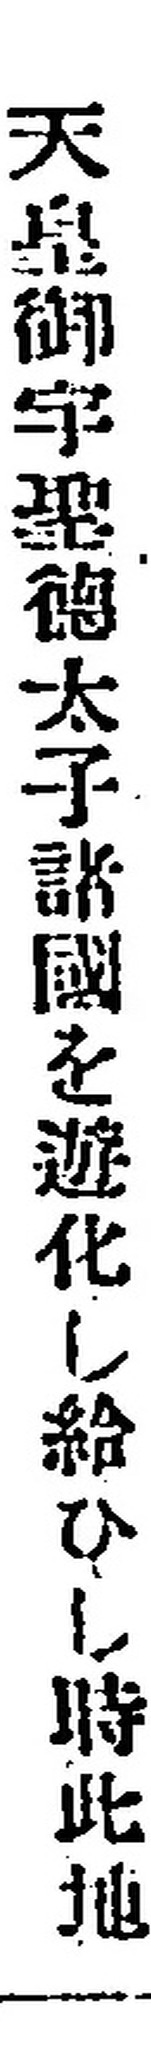天皇御宇聖徳太子諸国を遊化し給ひし時此地
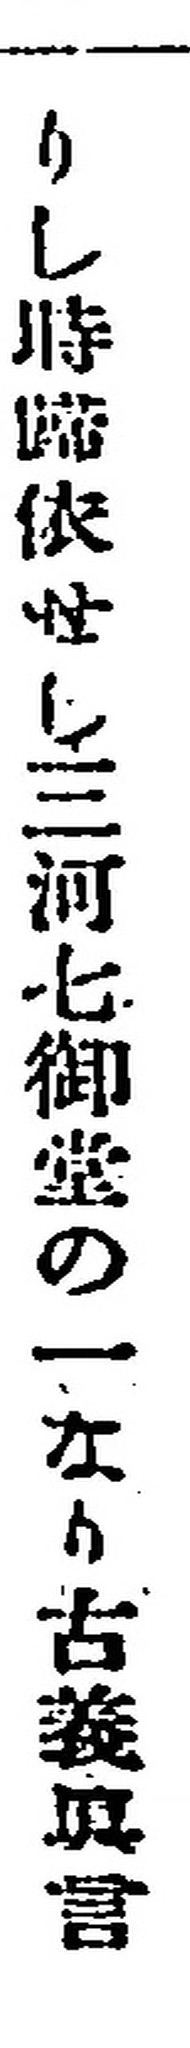りし時帰依せし三河七御堂の一なり古義真言
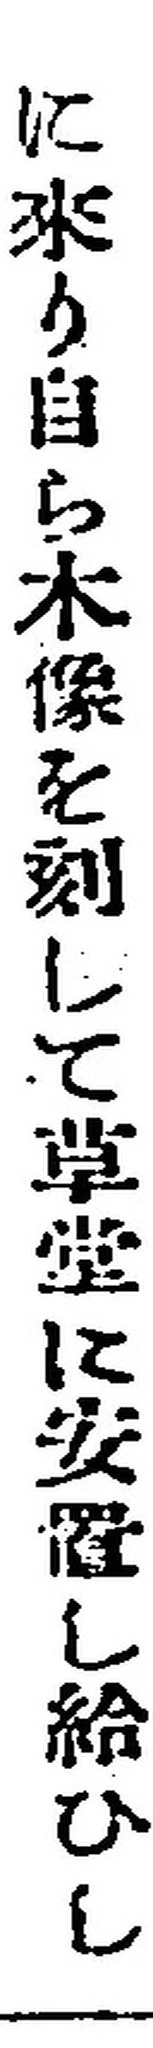に来り自ら木像を刻して草堂に安置し給ひし
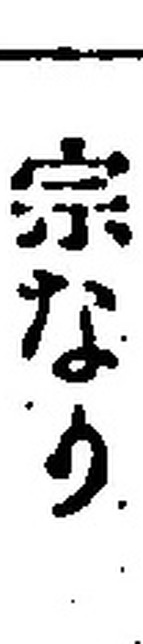宗なり
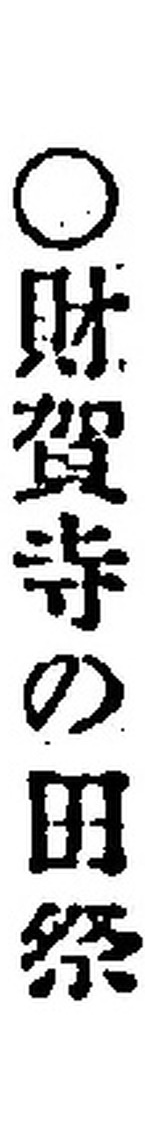○財賀寺の田祭
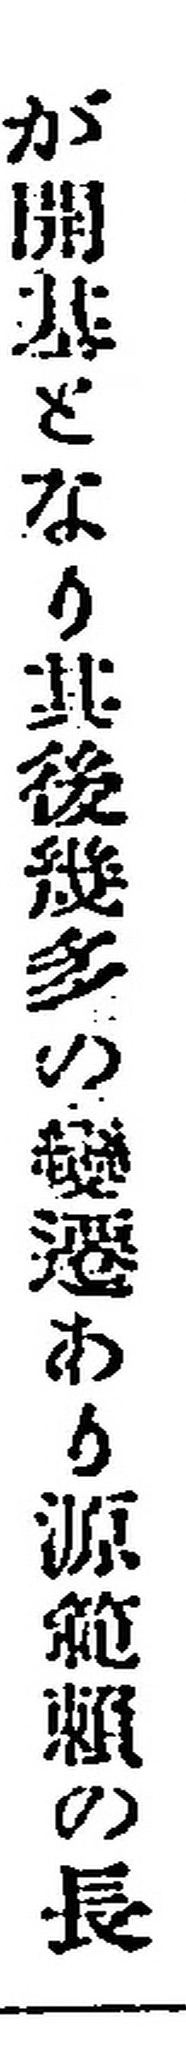が開基となり其後幾多の変遷あり源範頼の長
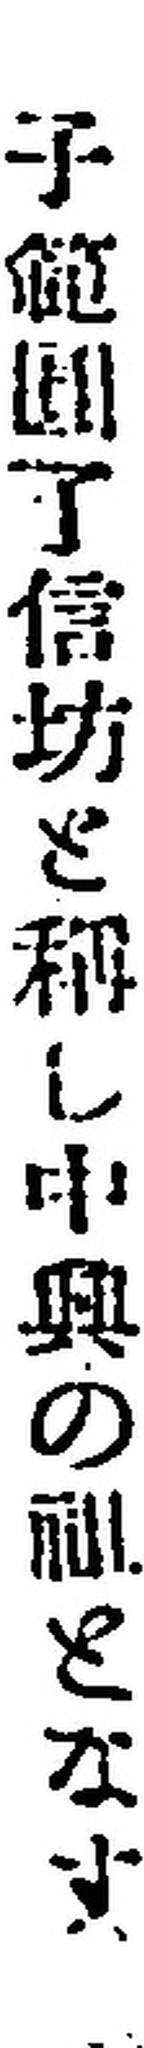子範円了信坊と称し中興の祖となす
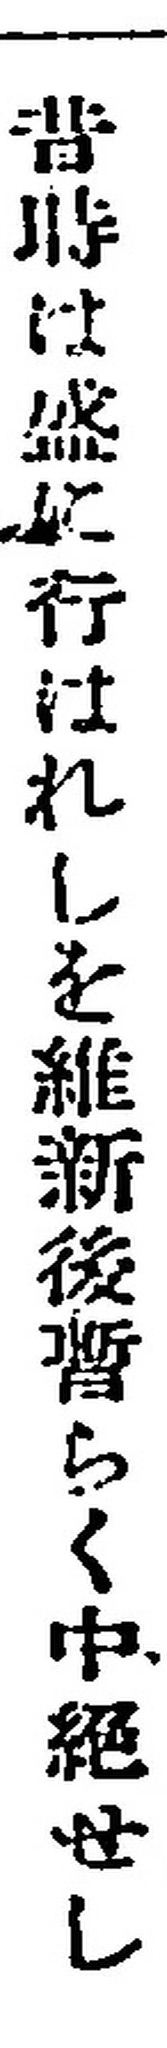昔時は盛に行はれしを維新後暫らく中絶せし
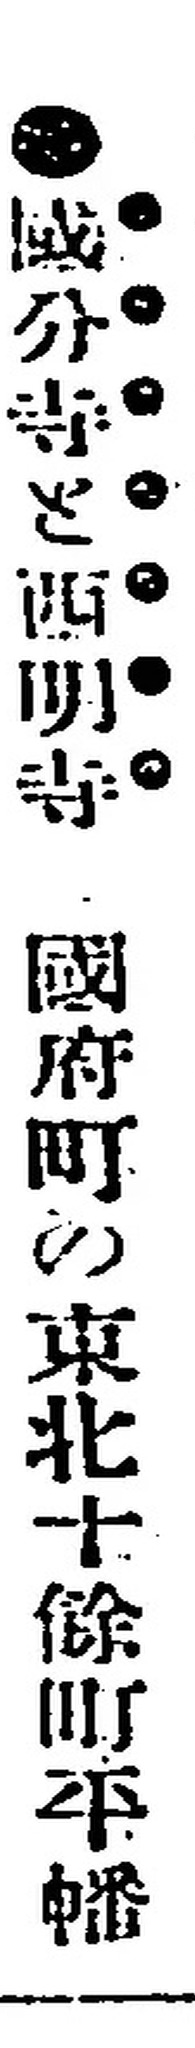●国分寺と西明寺国府町の東北十余町平幡
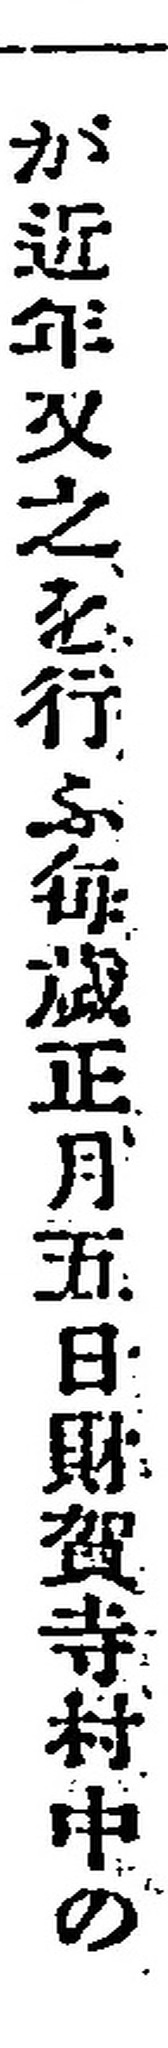が近年又之を行ふ毎歳正月五日財賀寺村中の
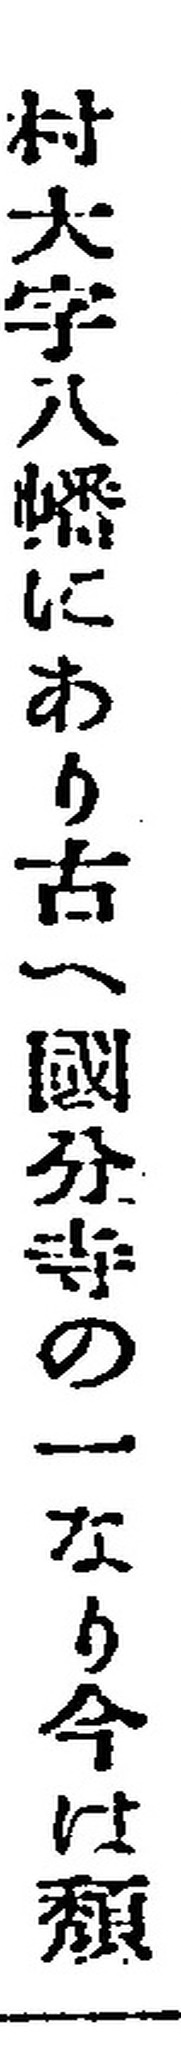村大字八幡にあり古へ国分寺の一なり今は頽
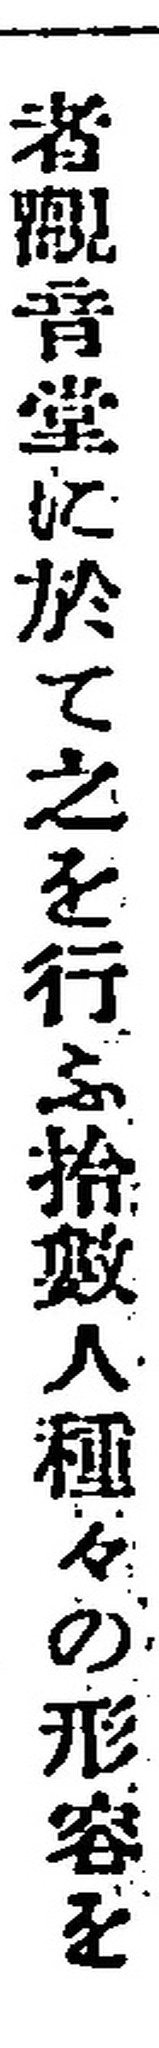者観音堂に於て之を行ふ拾数人種々の形容を
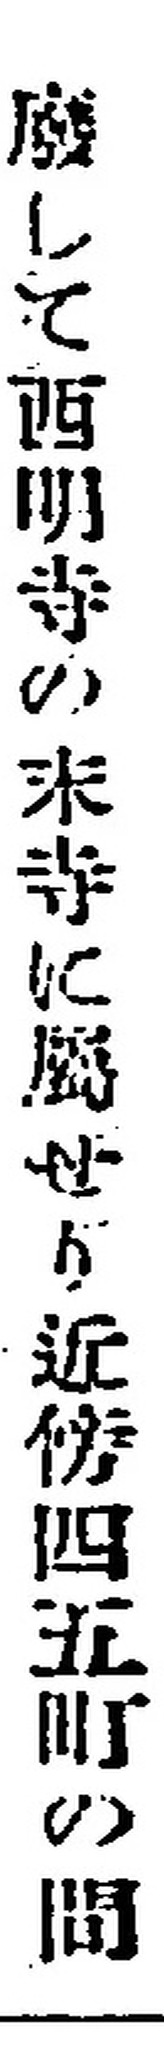廃して西明寺の末寺に属せり近傍四五町の間
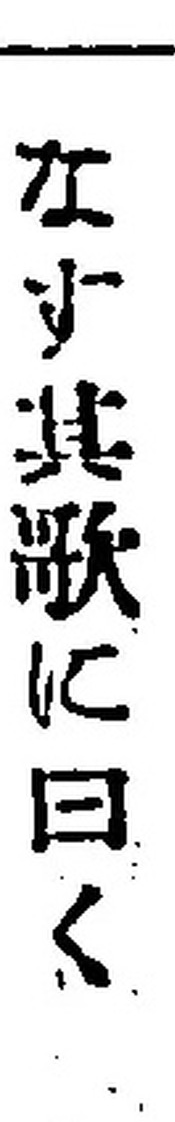なす其歌に曰く
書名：東参名勝案内
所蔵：国立国会図書館 National Diet Library, JAPAN
